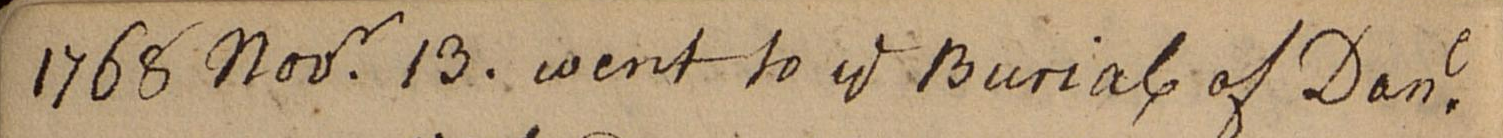1768 Nov^r. 13. went to y^e Burial of Dan^l.
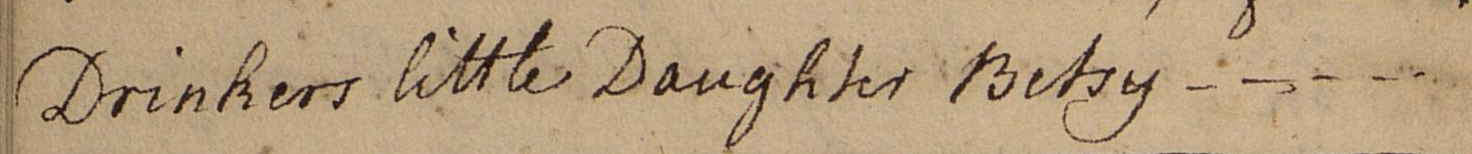Drinkers little Daughter Betsy-
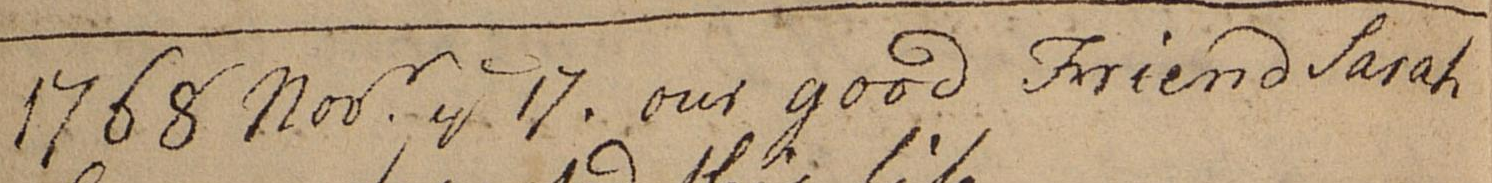1768 Nov^r. y^e 17. our good Friend Sarah
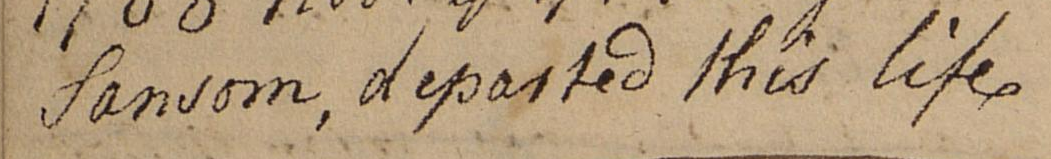Sansom, departed this life-
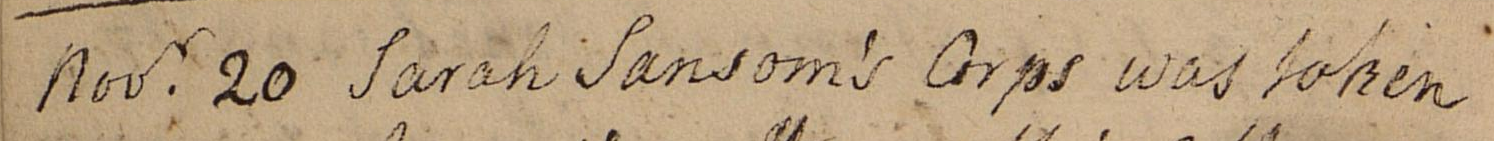Nov^r 20 Sarah Sansom's Corps was taken
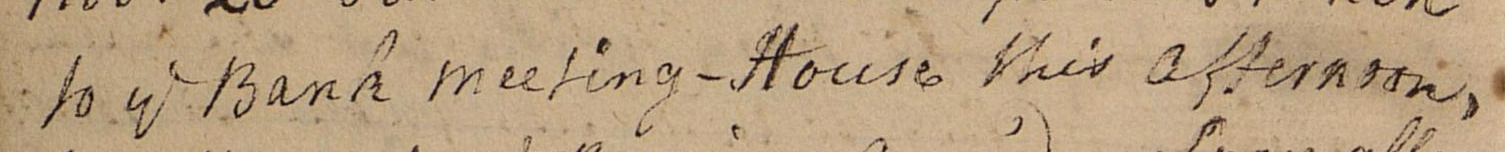to y^e Bank meeting- House this Afternoon,
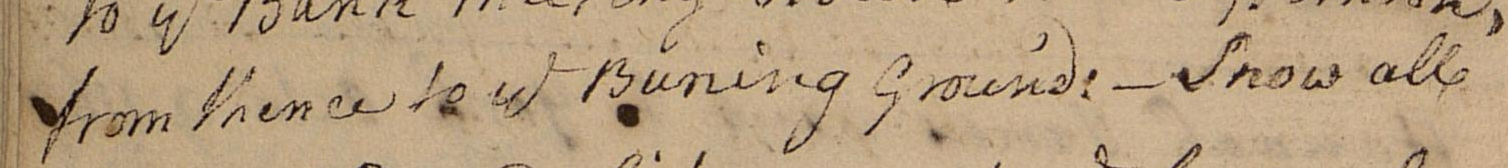from thence to y^e Burning Grounds- Snow all
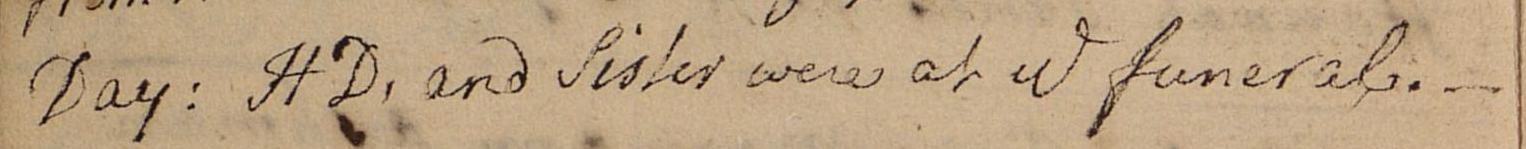Day: HD, and Sister were at y^e funeral.-
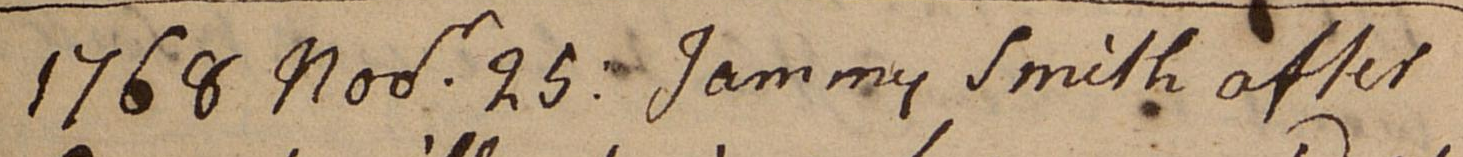1768 Nov^r. 25. Jammy Smith after
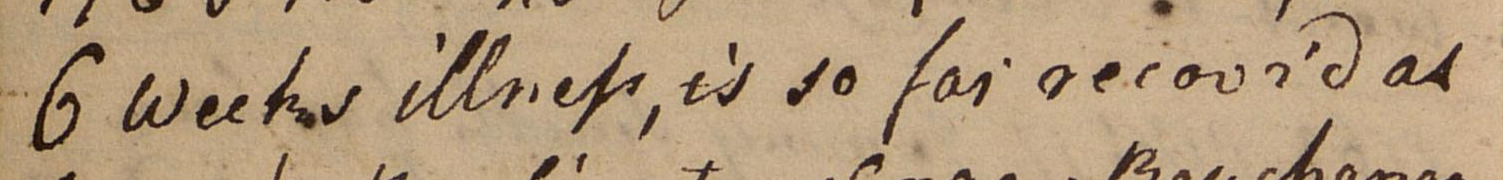6 weeks illness, is so far recovr'd as
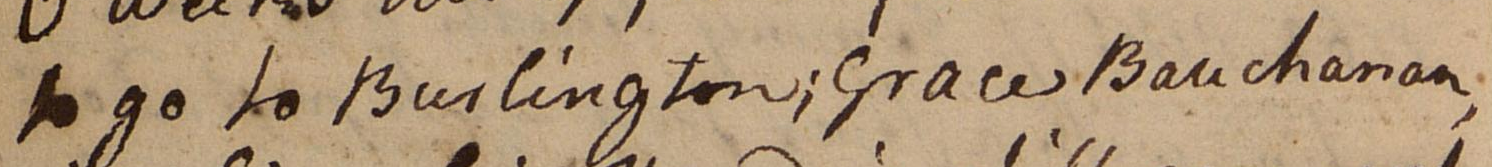to go to Burlington; Grace Bauchanan,
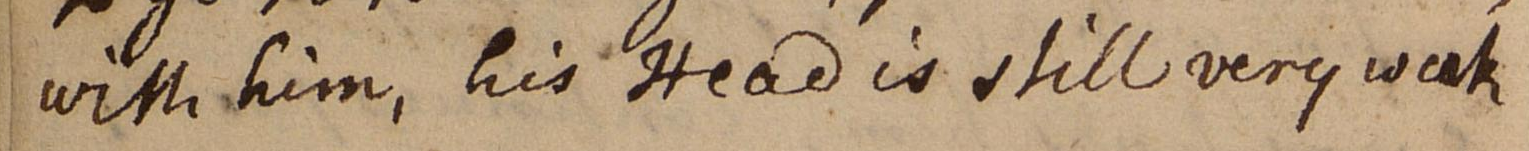with him, his Head is still very weak
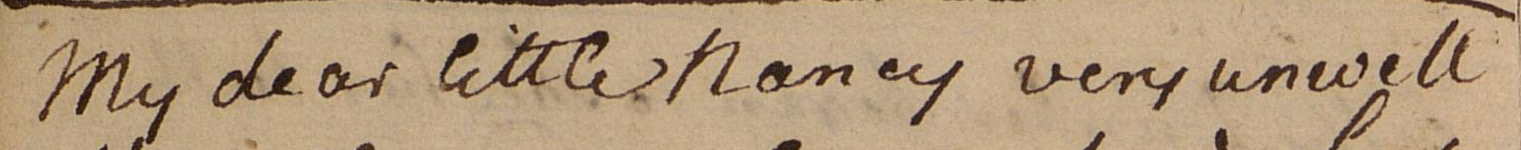My dear little Nancy very unwell
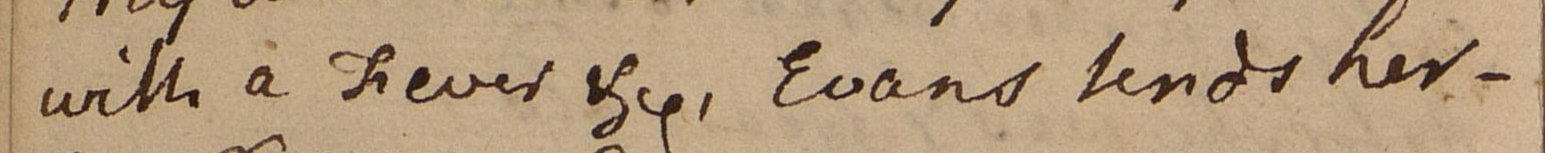with a Fever &c, Evans tends her-
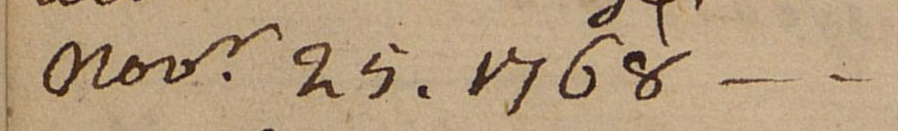Nov^r. 25. 1768-
